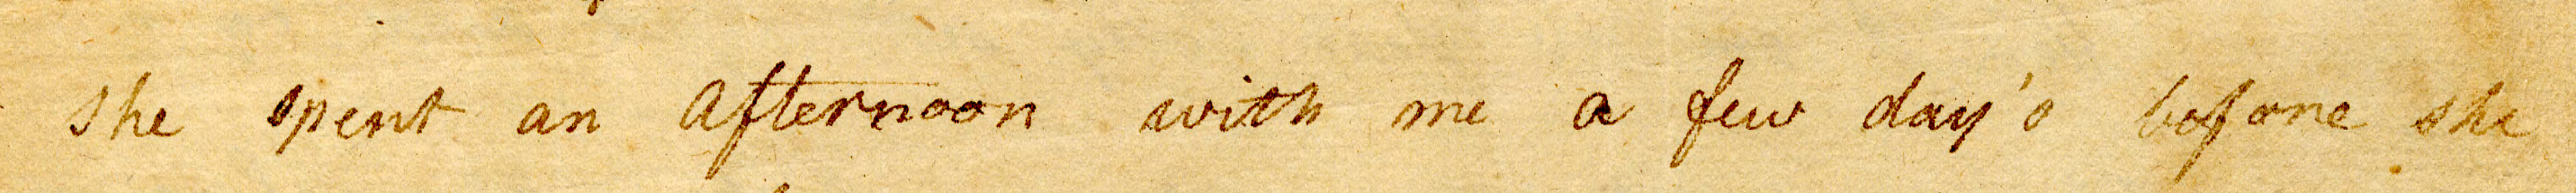she spent an afternoon with me a few day's before she
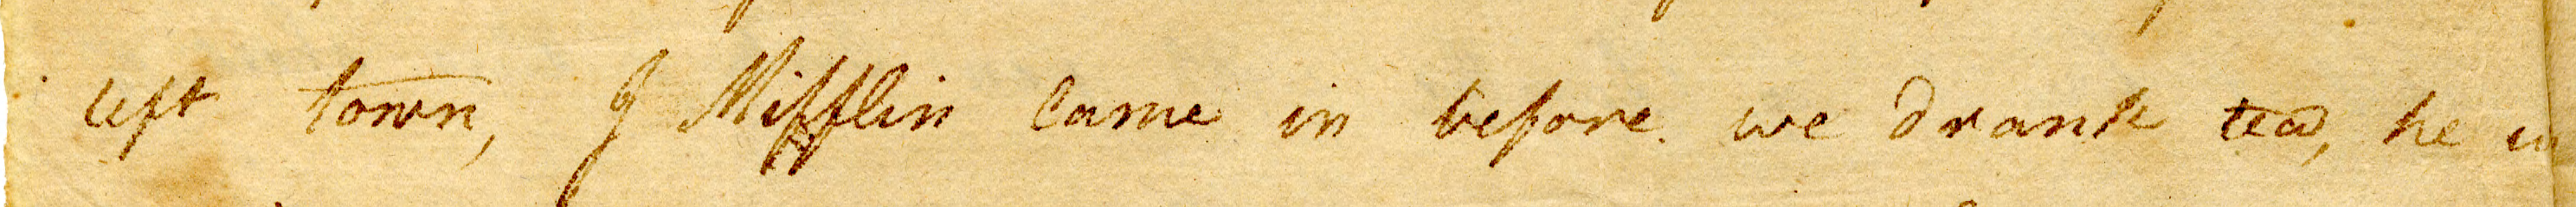left town, J Mifflin came in before we drank tea, he is
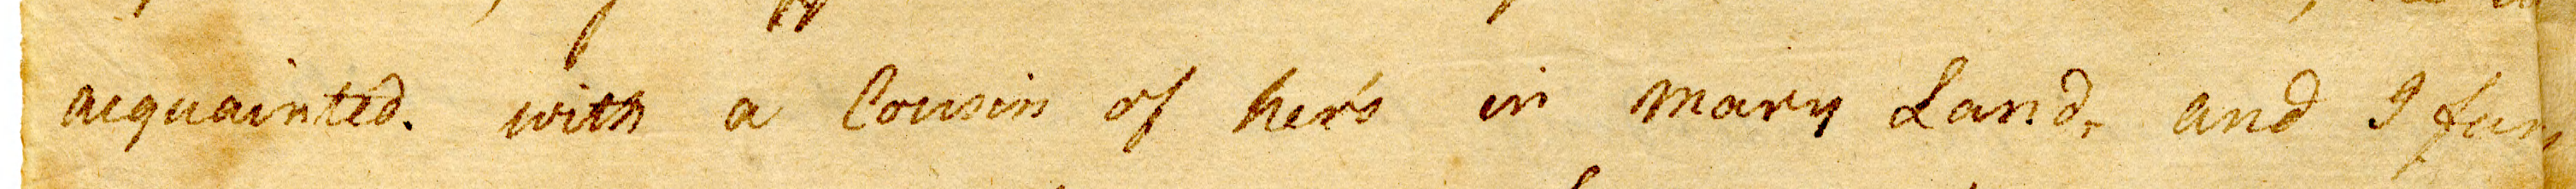acquainted with a Cousin of her's in Mary Land and I far
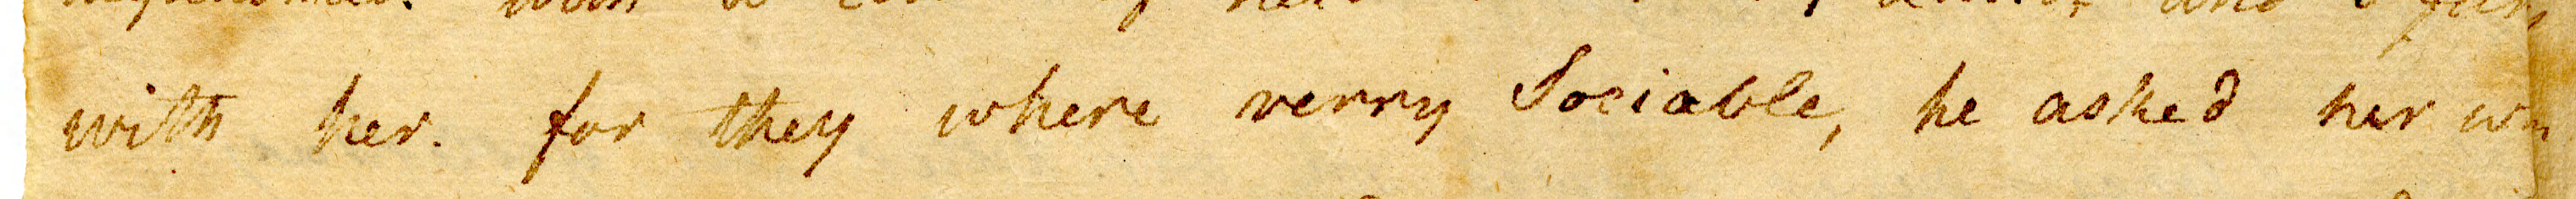with her for they where verry Sociable, he asked her w
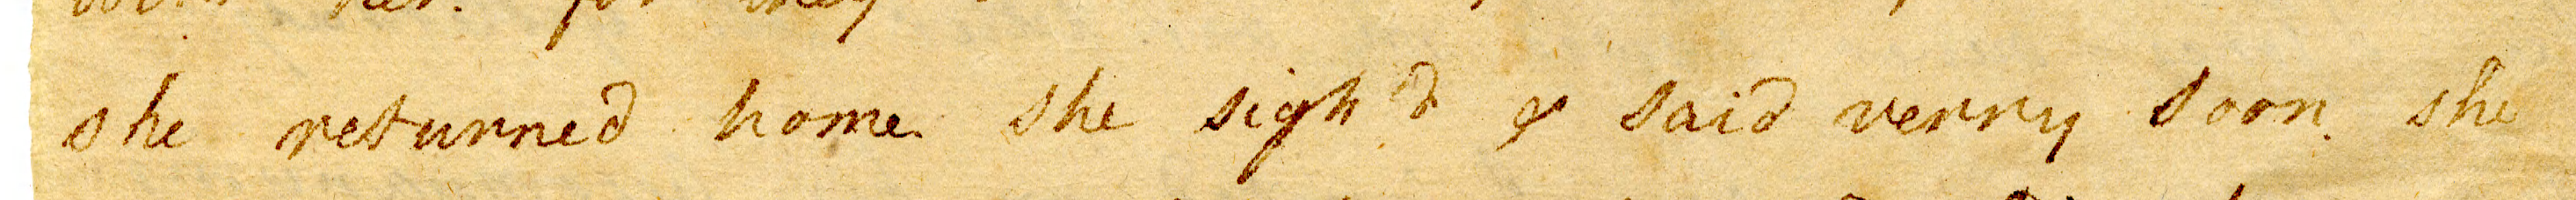she returned home she sigh'd & said verry soon she
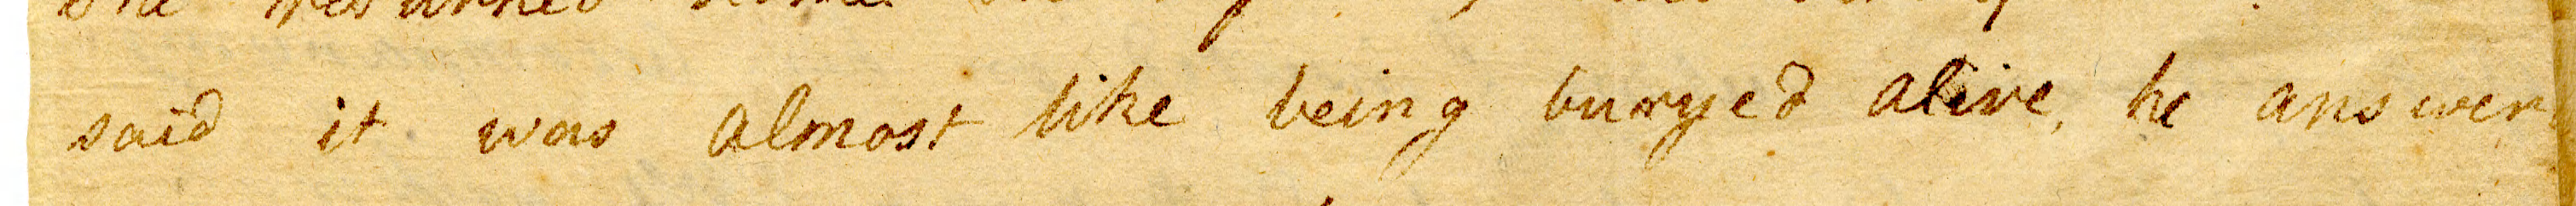said it was almost like being buryed alive, he answer
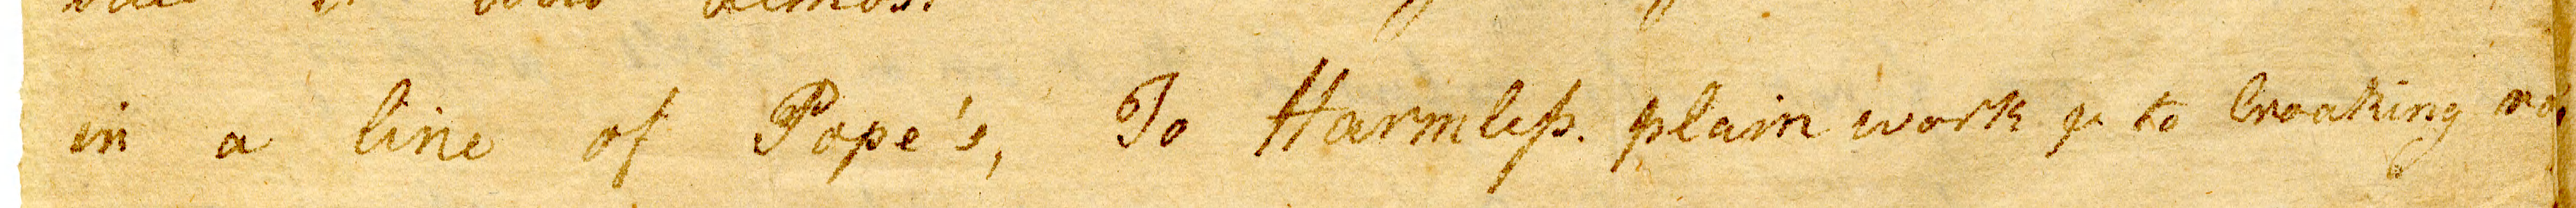in a line Pope's, To Harmless plain work & to croaking no
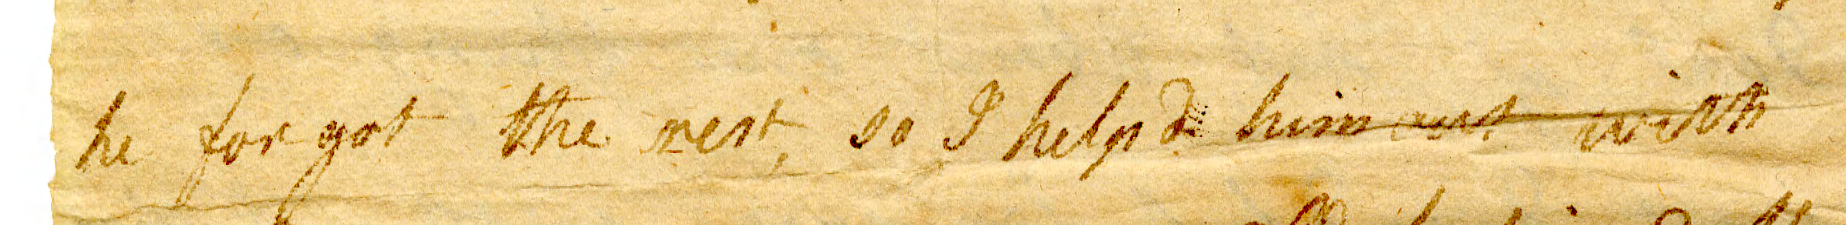he forgot the rest, so I helpd him out with
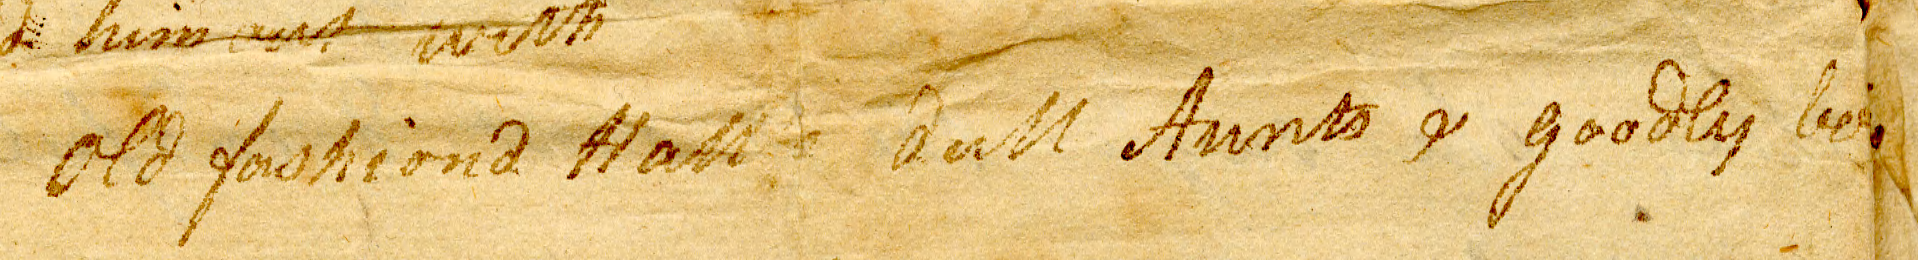Old fashioned Halls dull Aunts & goodly be
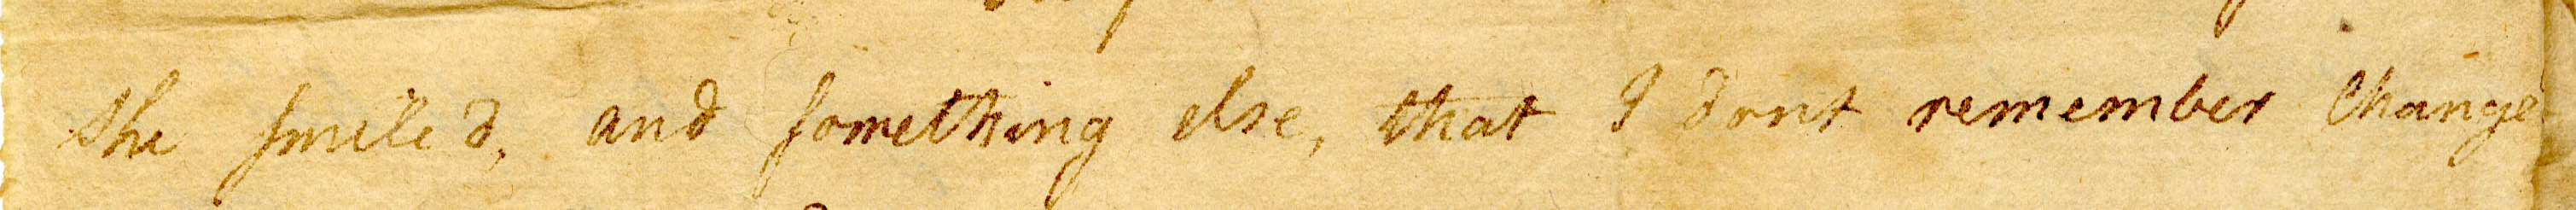she smiled and something else that I dont remember change
